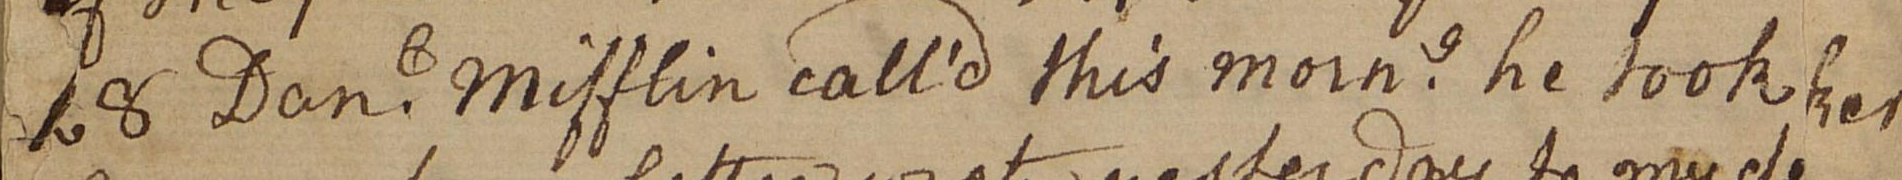[2]8 Dan^l. Mifflin call'd this morn^g. he took
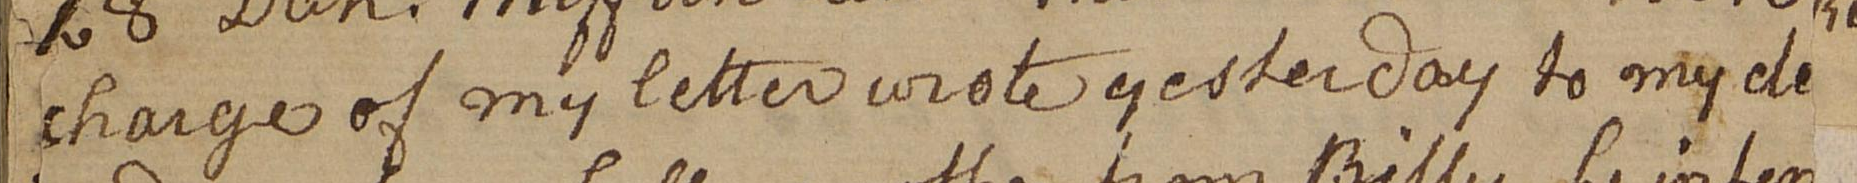charge of my letter wrote yesterday to my de
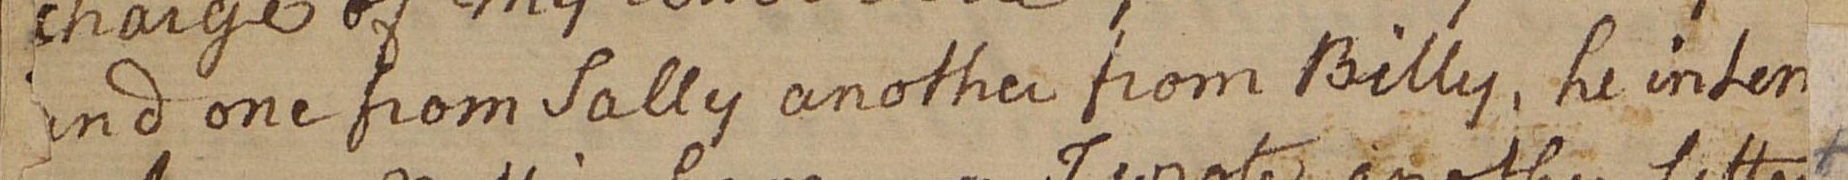[_]nd one from Sally another from Billy, he inten
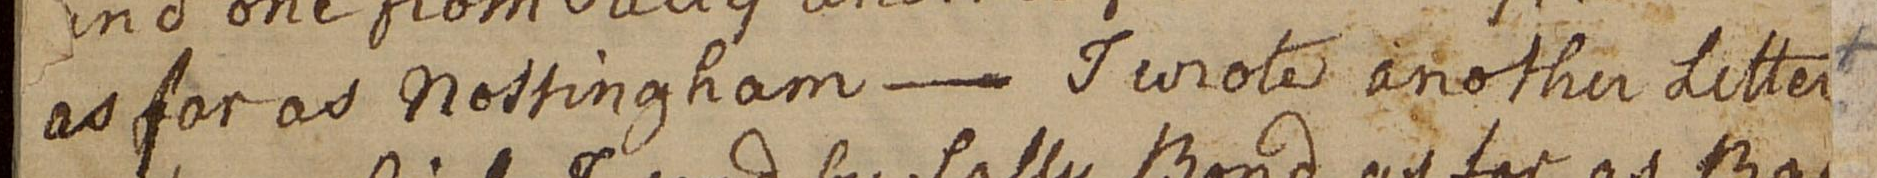as for as Nottingham- I wrote another Letter
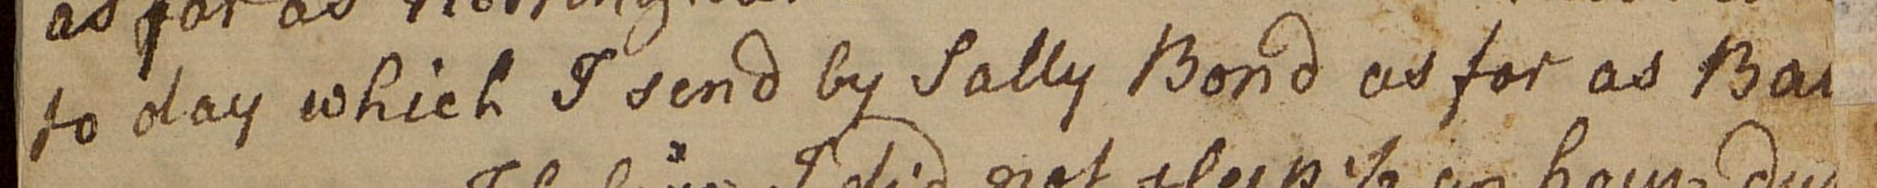to day which I send by Sally Bond as for as Ba[_]
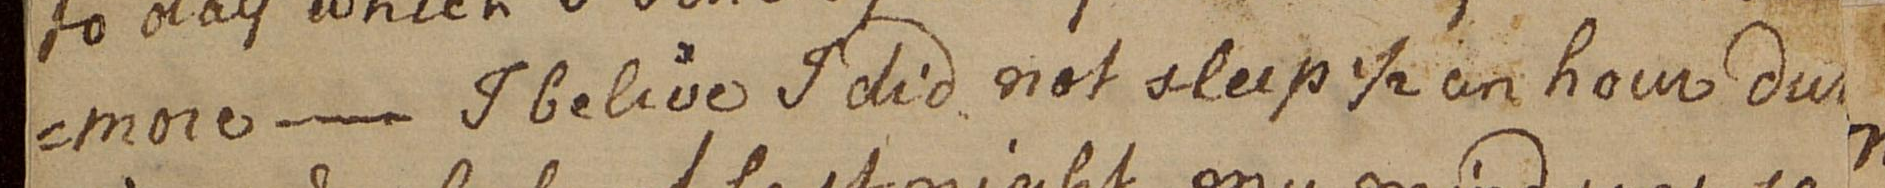-more- I belive I did not sleep 1/2 an hour du[_]
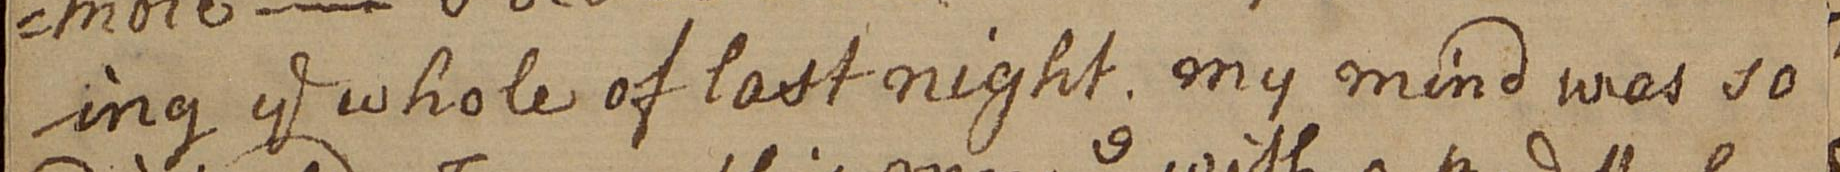-ing y^e whole of last night. my mind was so
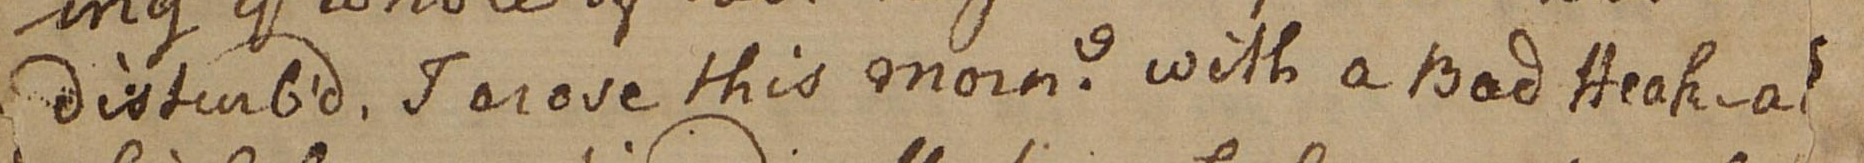disturb'd. I arose this morn^g. with a Bad Heak-a
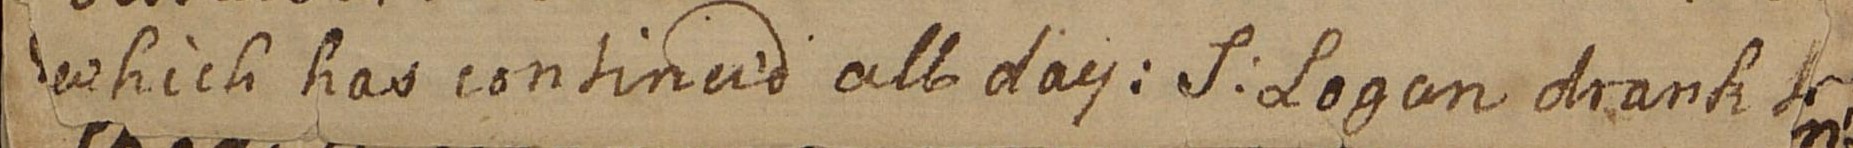which has continued all day: S: Logan drank [_]
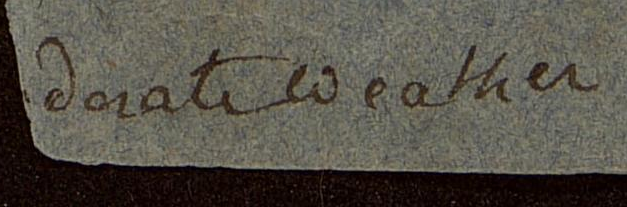derate weather
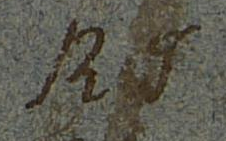RS
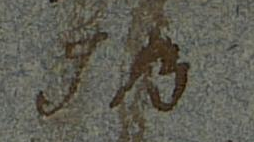JB
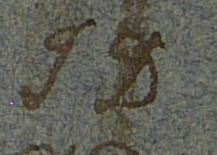JD
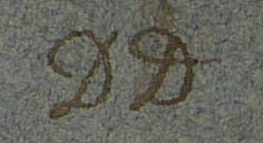DD
